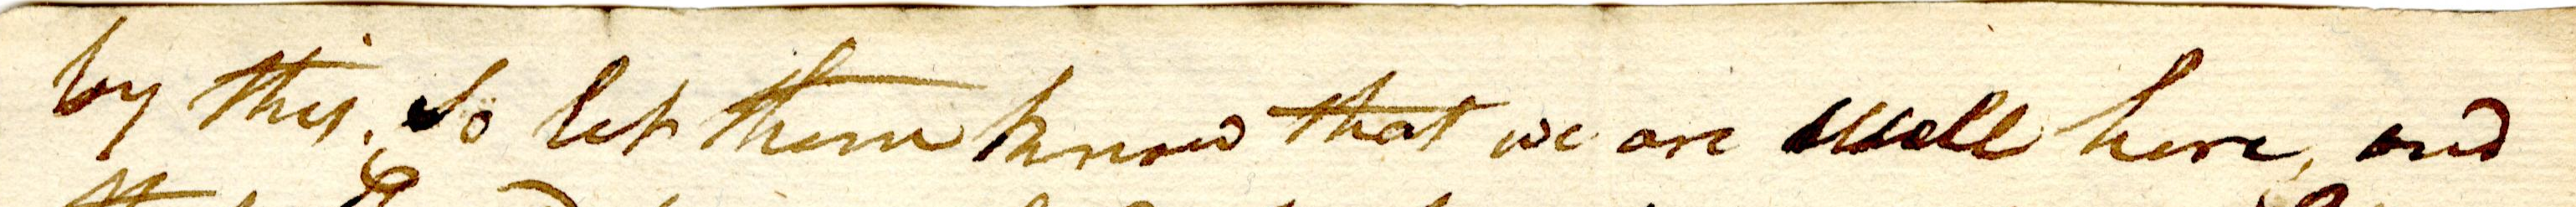by this so let them know that we on stell here, and
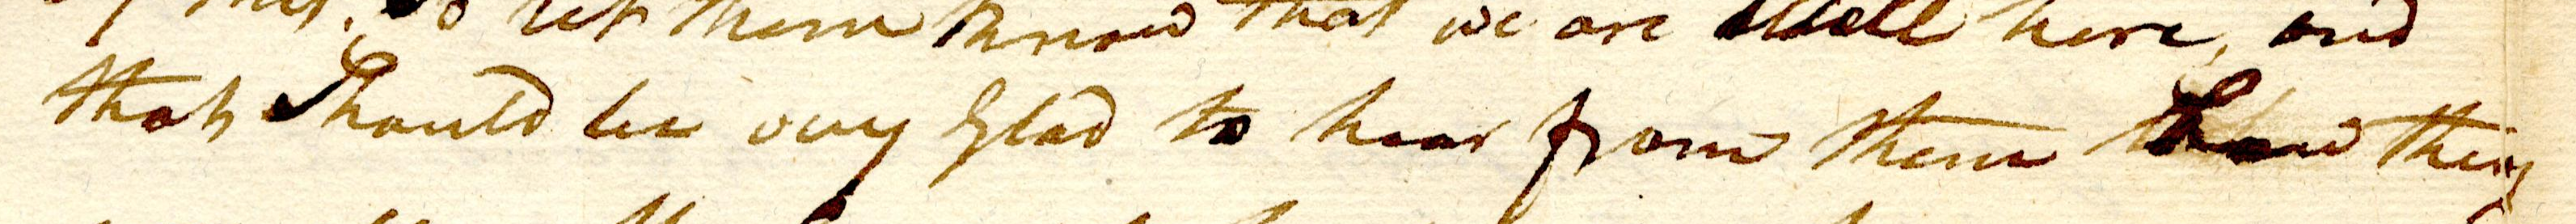that Should be very Glad to hear from them how they
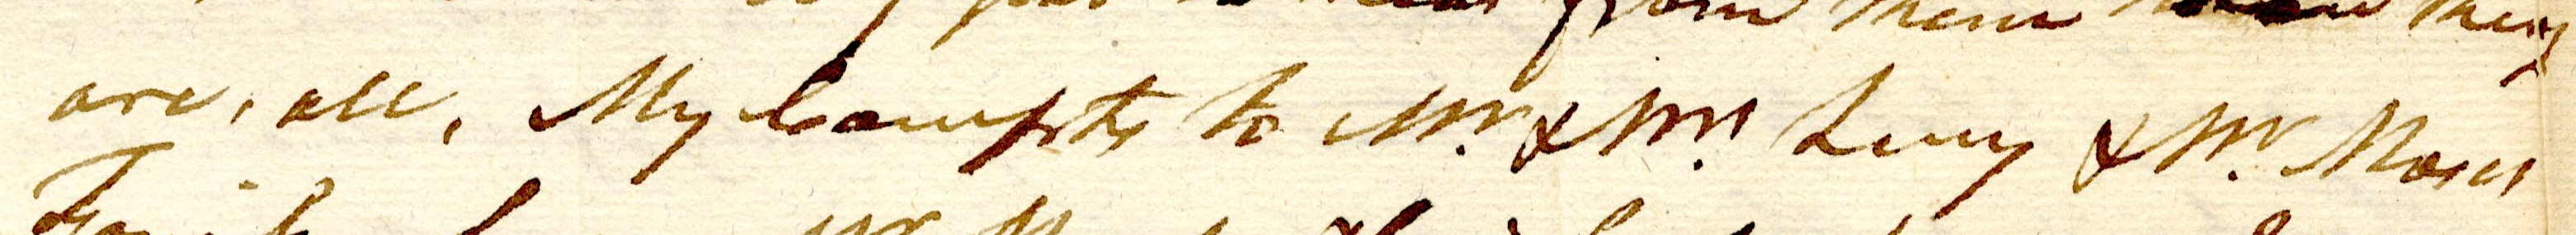are, all, My Comp^ts to M^r. & M^rs. Levy & M^r. Moses
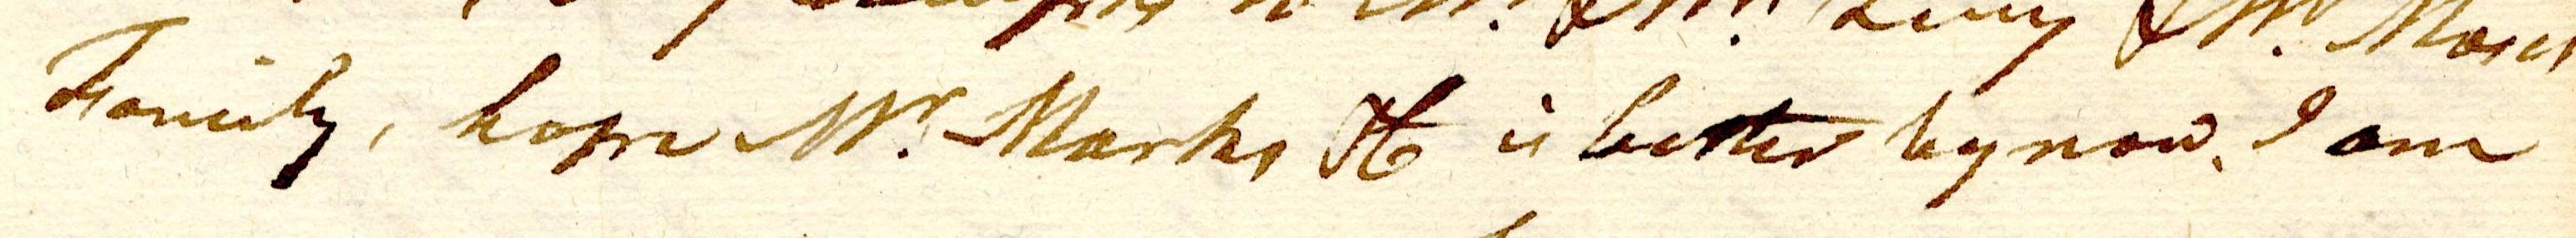Family, hope M^r Marks &C is better by now. I am
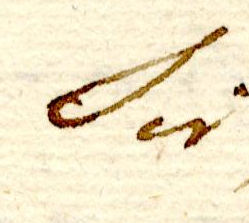Sir
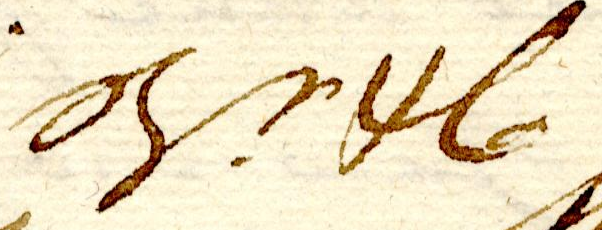Y^r &C
